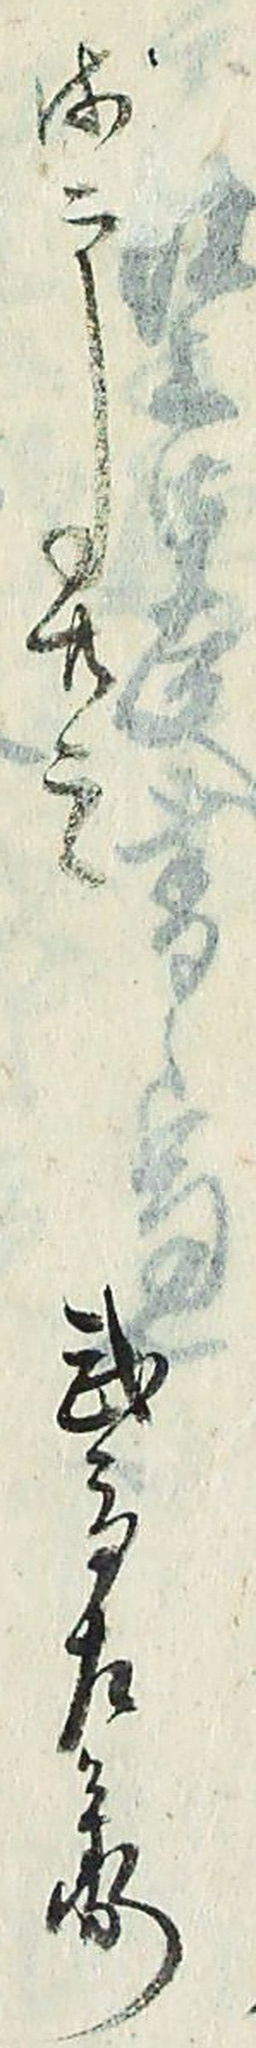戌二月廿二日武市左兵衛
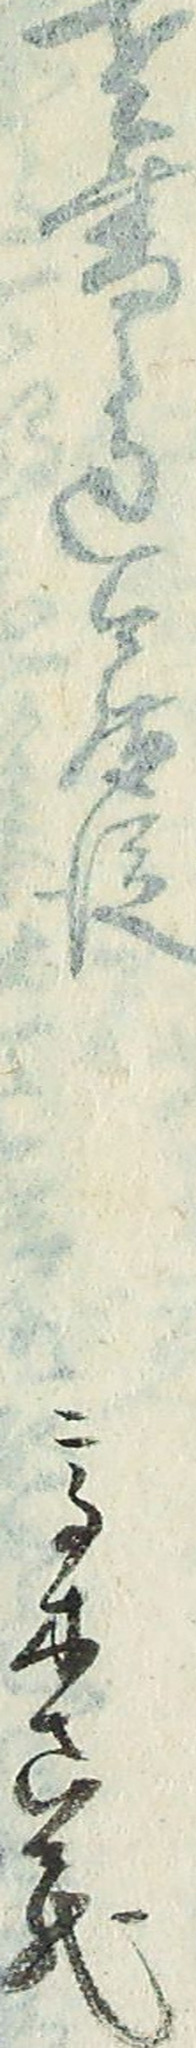高木真蔵
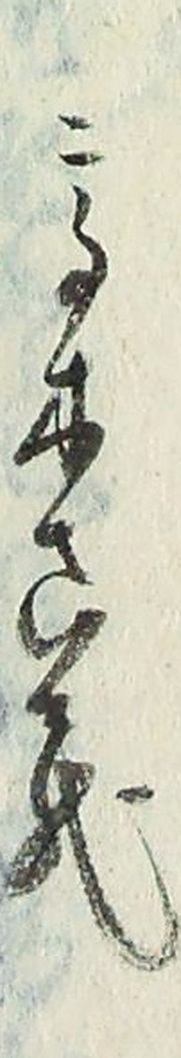高木真蔵
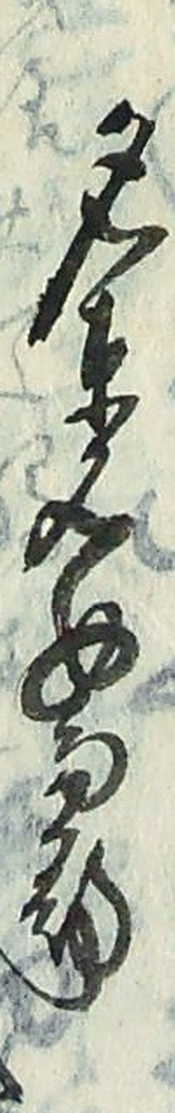名東名西両郡
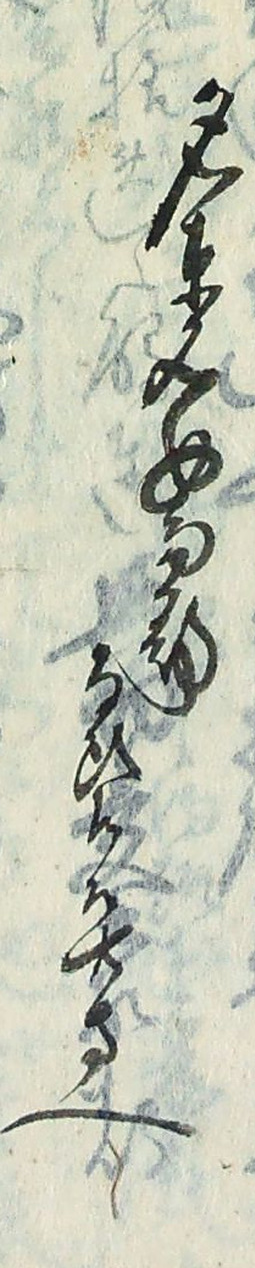名東名西両郡
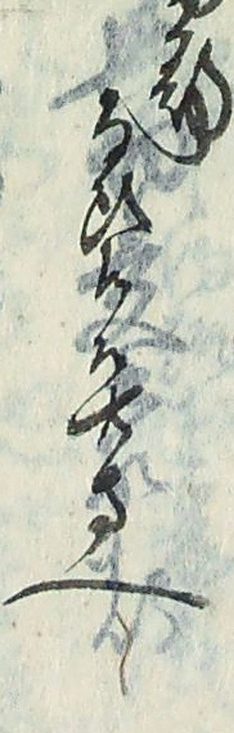与頭庄屋共方へ
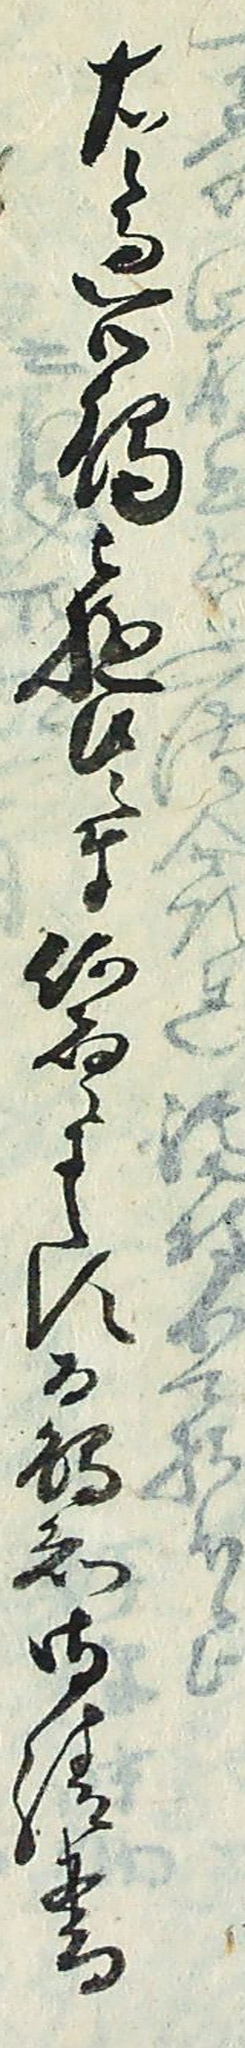右之通御触被遊候に付何者によらす為触知御請書
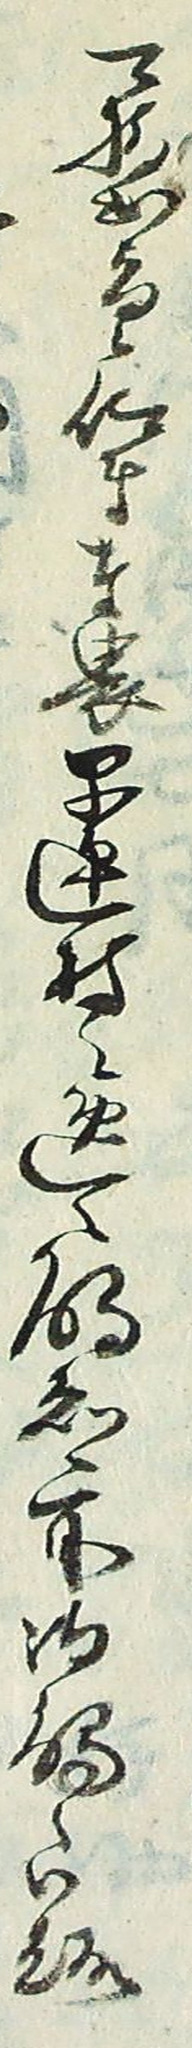可指出旨被仰付奉畏早速村中逸々触知候所御触之御趣
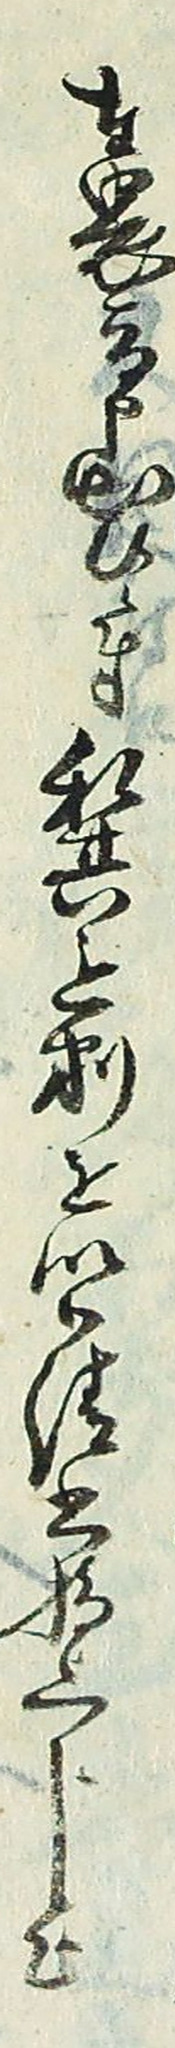奉畏旨申出候に付私共連判を以御請書指上申候以上
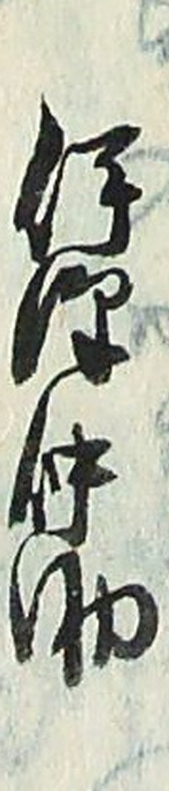伊澤仲助
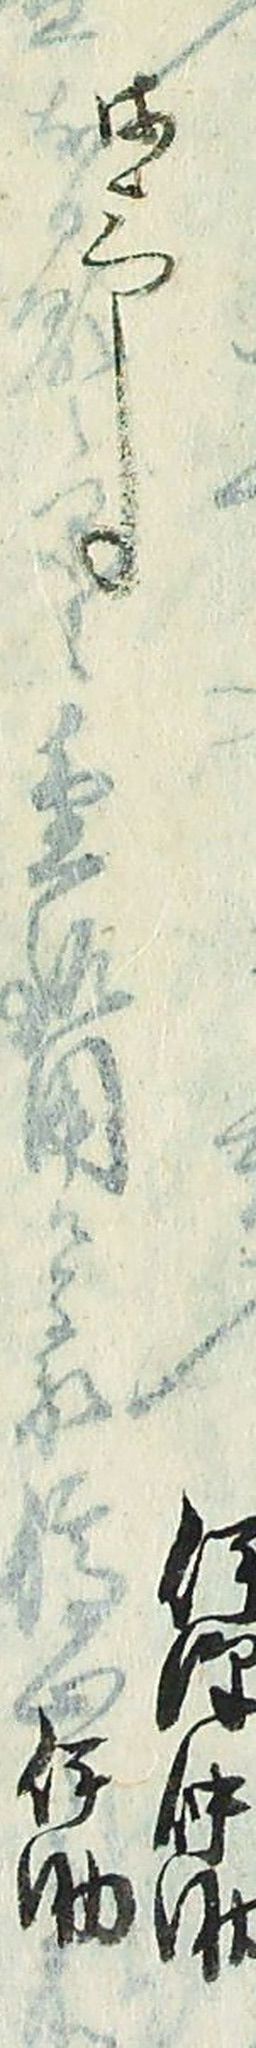戌三月伊助
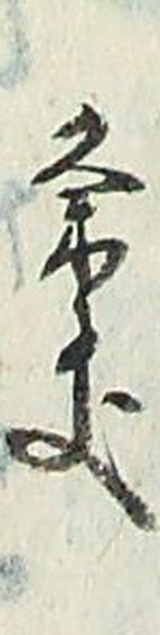久米之丈
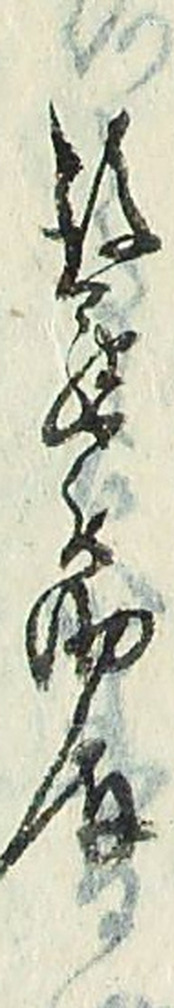後藤善助殿
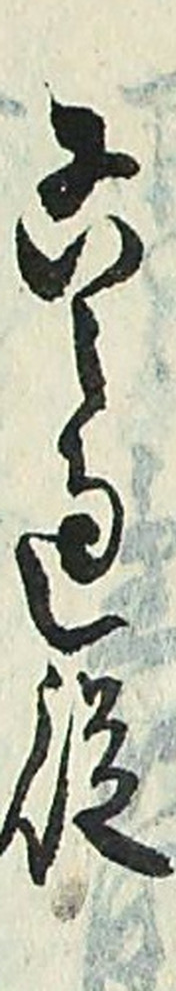右之通従
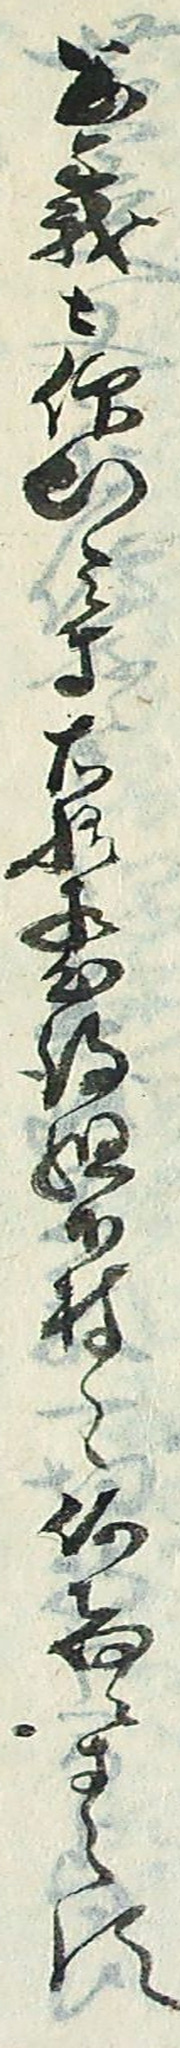公義被仰出候に付右様相心得組下村々何者によらす
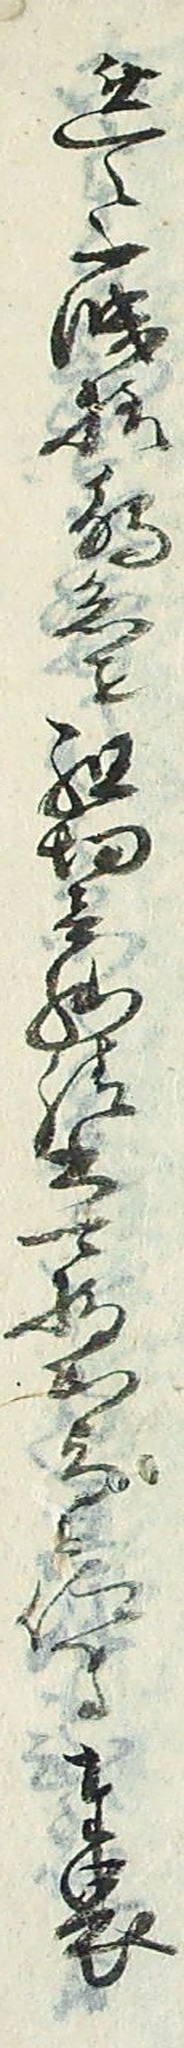逸々不洩様触知せ組切壱紙請書可指出旨被仰付奉畏
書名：諸御用御□受書控
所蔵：鳴門教育大学 Naruto University of Education
